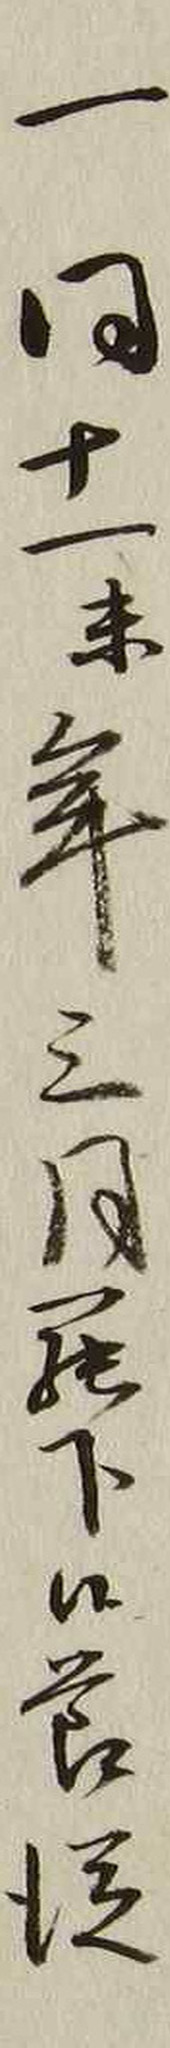一同十一未年三月罷下候節従
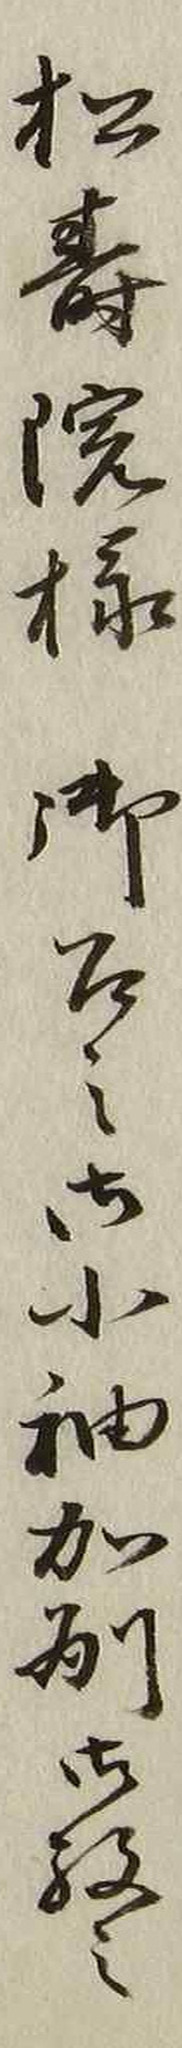松寿院様御召之小袖加州御紋之
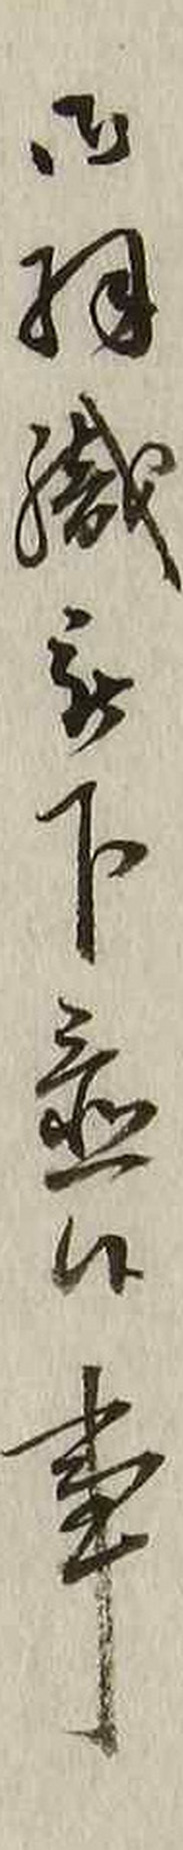御羽織被下置候事
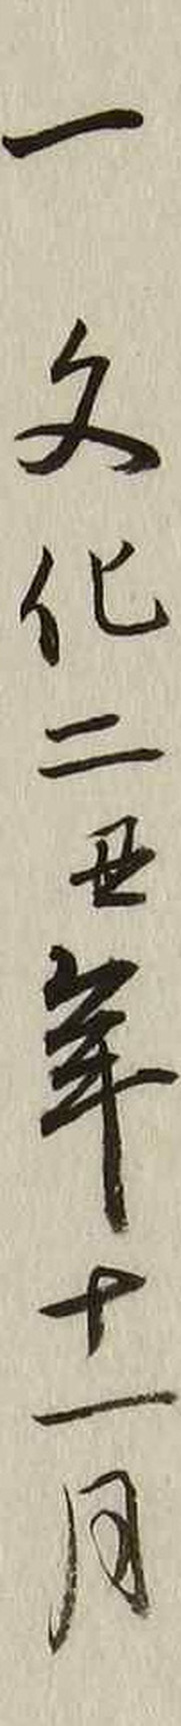一文化二丑年十一月
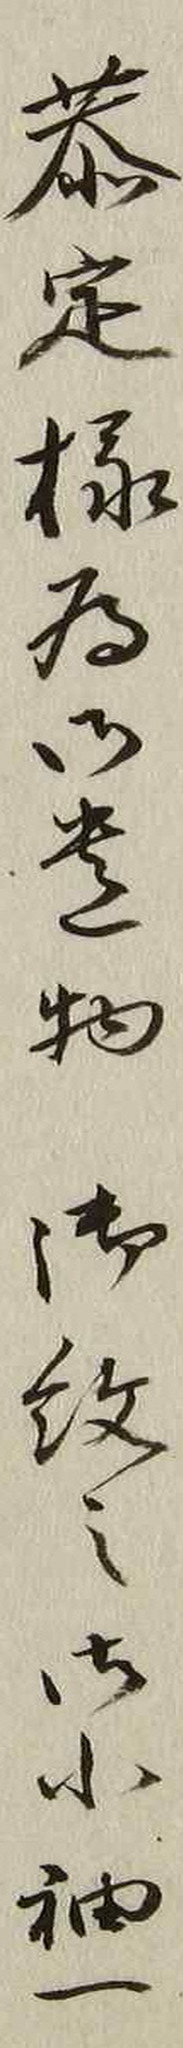恭定様為御遺物御紋之小袖一
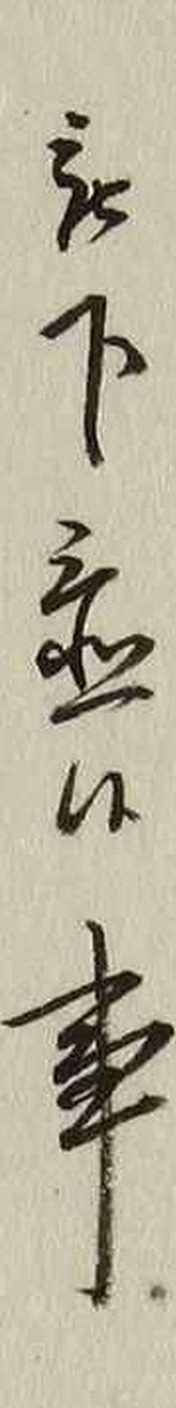被下置候事
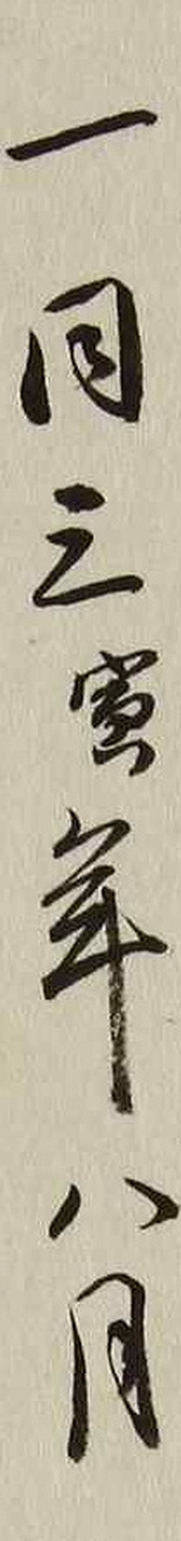一同三寅年八月
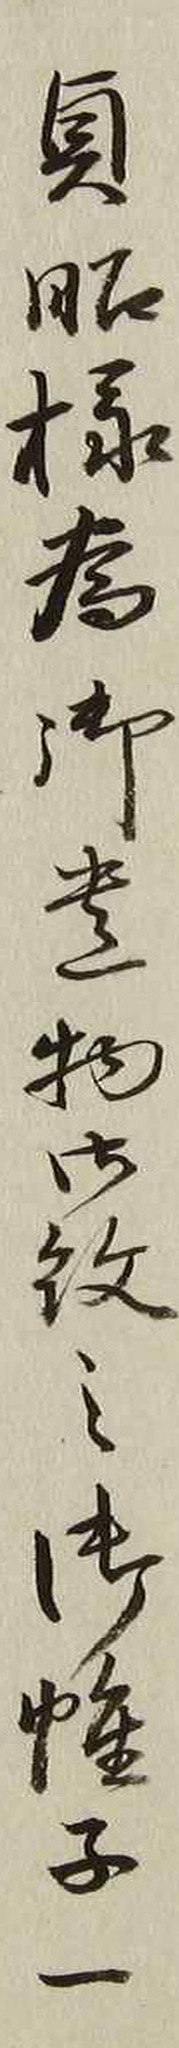貞昭様為御遺物御紋之御帷子一
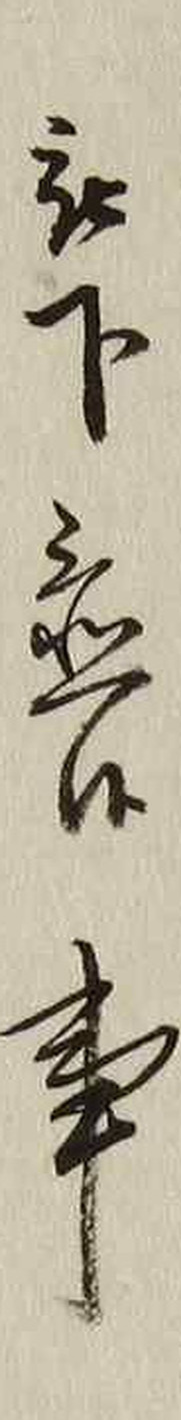被下置候事
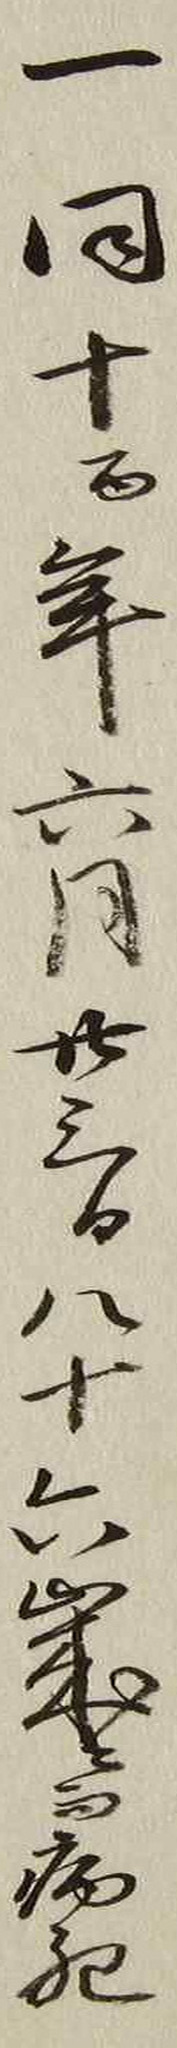一同十酉年六月廿三日八十六才ニ而病死
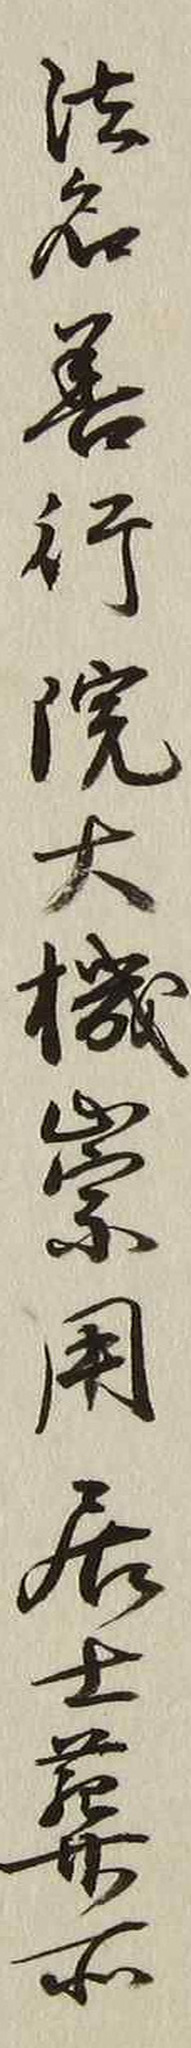法名善行院大機崇用居士葬所
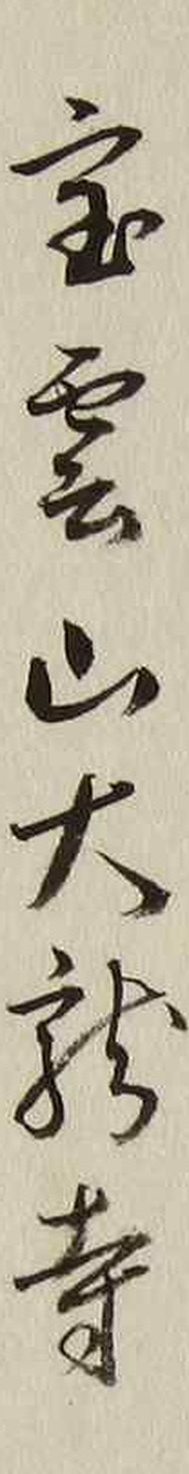宝曇山大龍寺
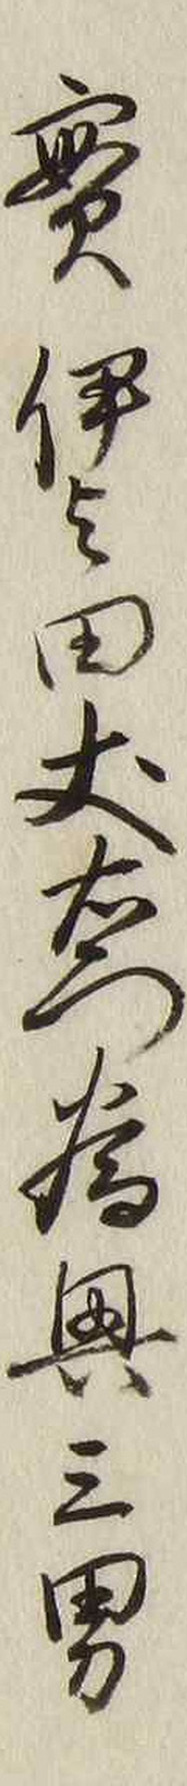実伊与田丈右衛門為興三男

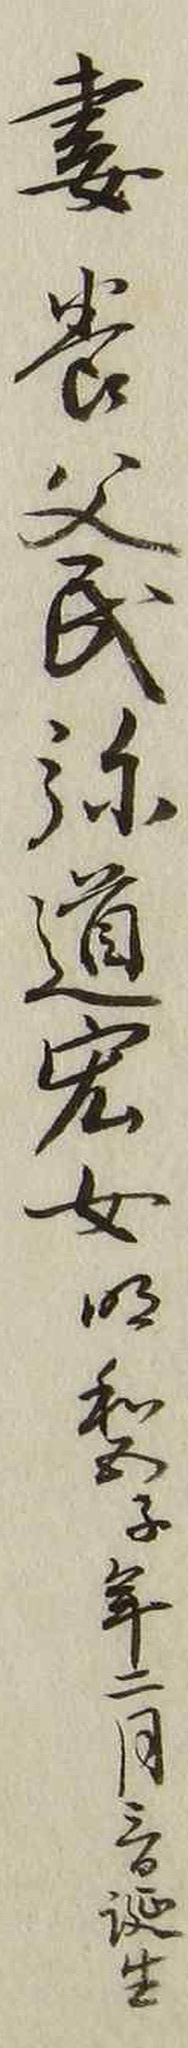妻養父氏弥道宏女明和五子年二月三日誕生
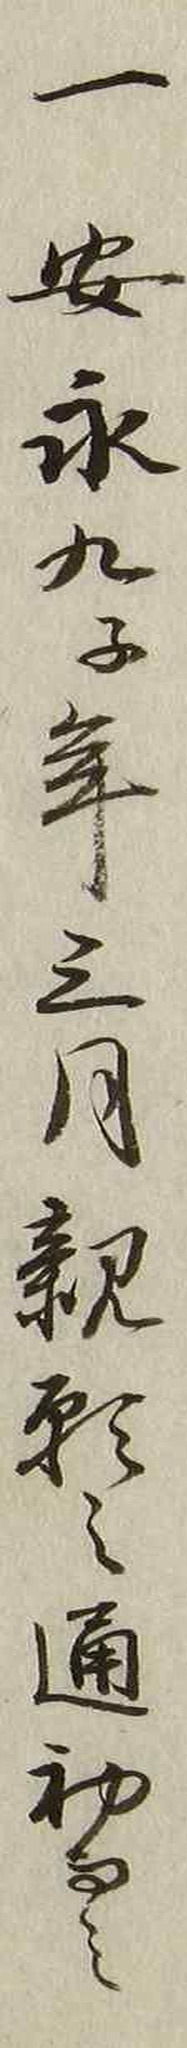一安永九子年三月親願之通初而之
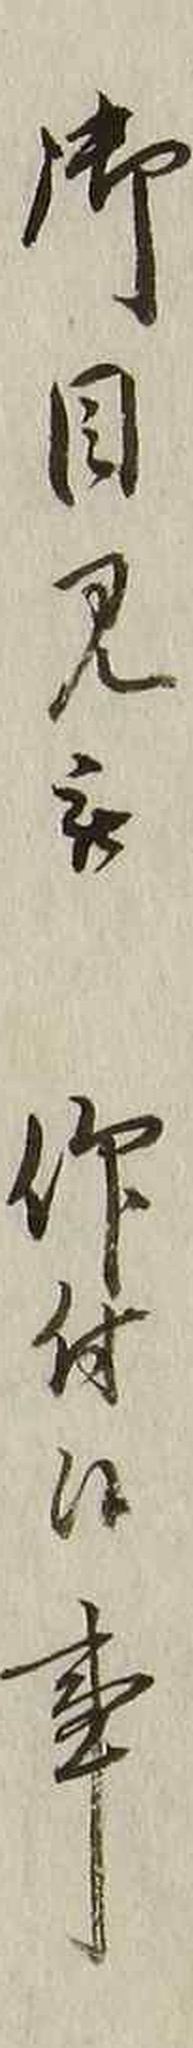御目見被仰付候事
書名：諸士系譜　巻之160　な之部2
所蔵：会津若松市立会津図書館
